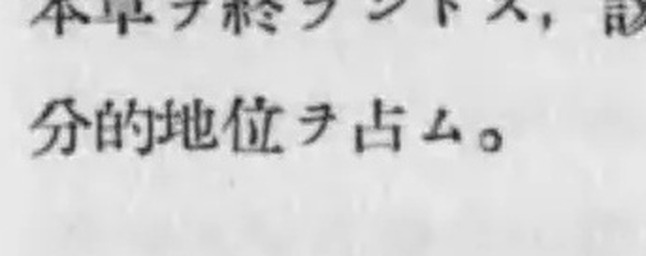分的地位を占む。

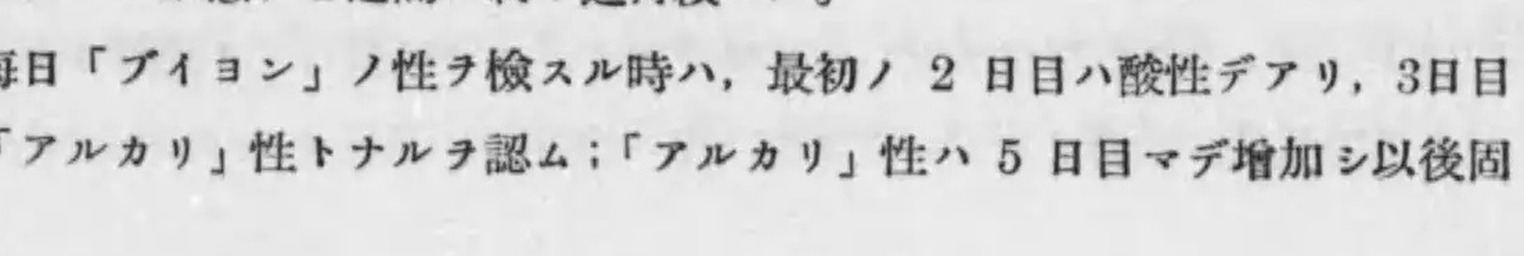に「アルカリ」性となるを認む;「アルカリ」性は日目まで増加し以後固

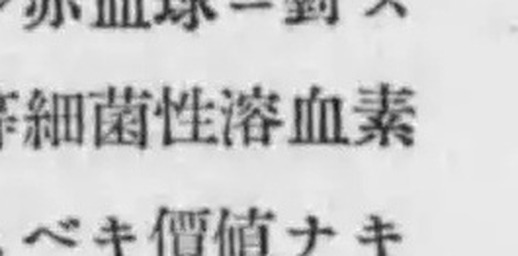細菌性溶血素

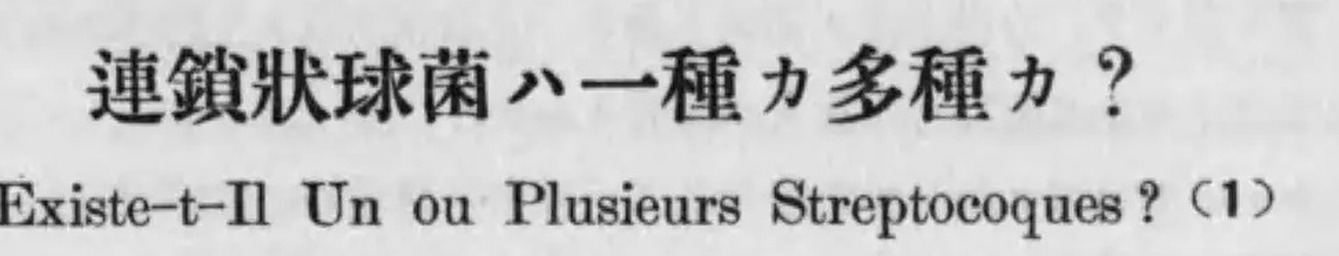連鎖状球菌は一種か多種か？

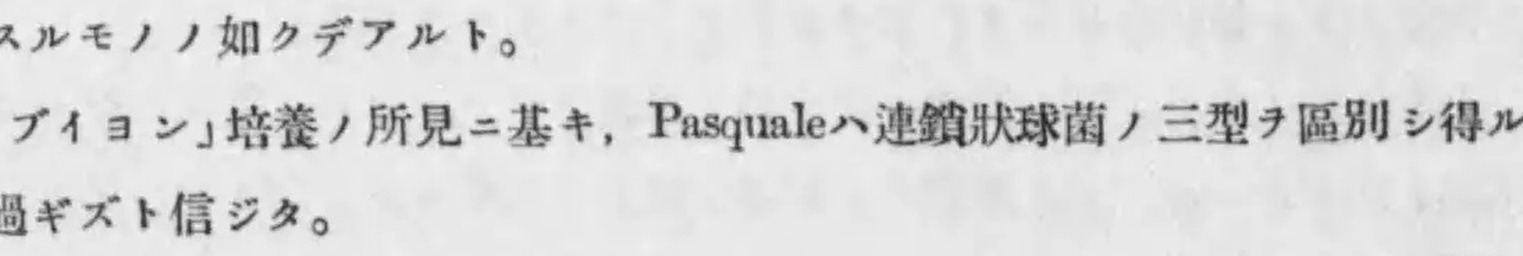「ブイヨン」培養の所見に基き、は連鎖状球菌の三型を区別し得る

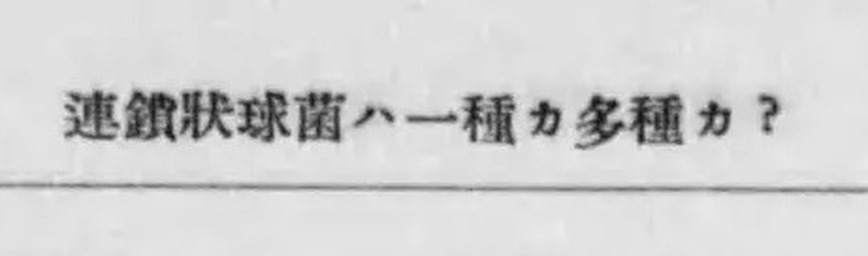連鎖状球菌は一種か多種か？
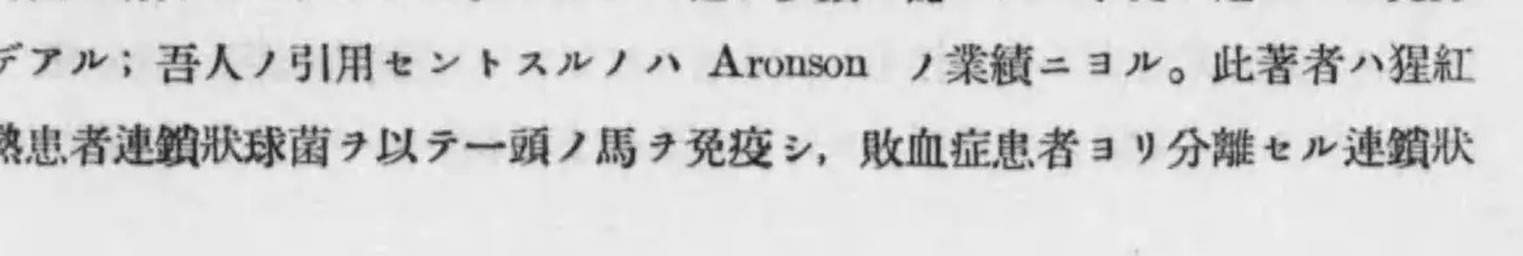熱患者連鎖状球菌を以て一頭の馬を免疫し、敗血症患者より分離せる連鎖状
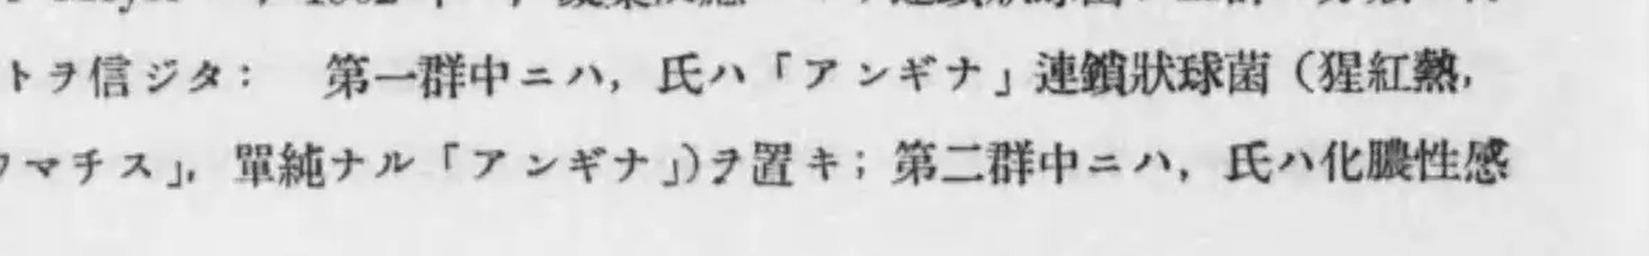「リウマチス」、単純なる「アンギナ」)を置き;第二群中には、氏は化膿性感

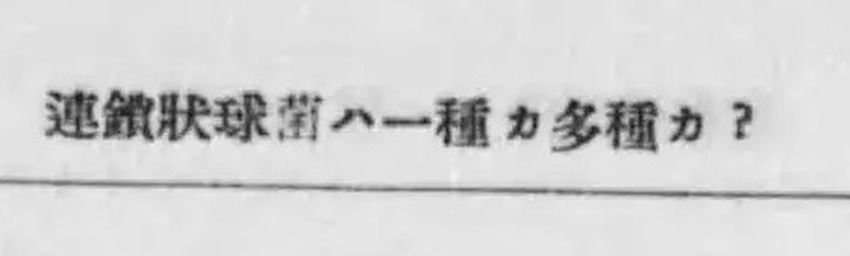連鎖状球菌は一種か多種か？

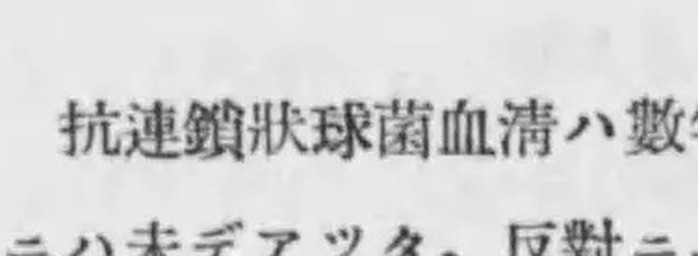抗連鎖状球菌血清治療法()

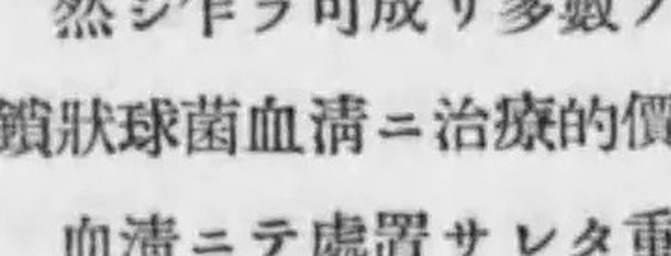抗連鎖状球菌血清治療法

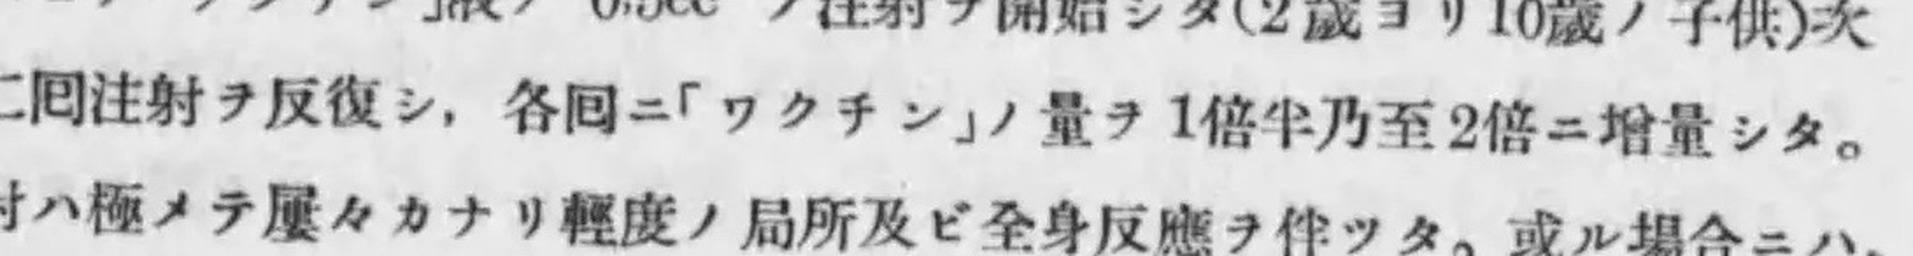いで二回注射を反復し、各回に「ワクチン」の量を倍半乃至倍に増量した。
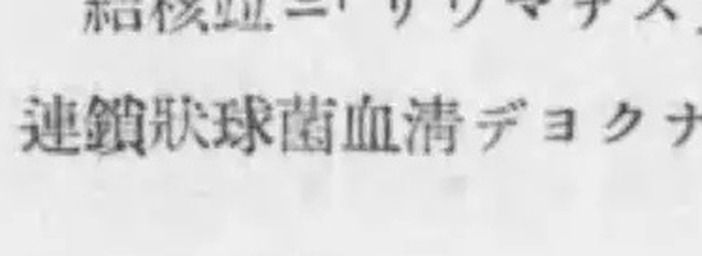抗連鎖状球菌血清治療法

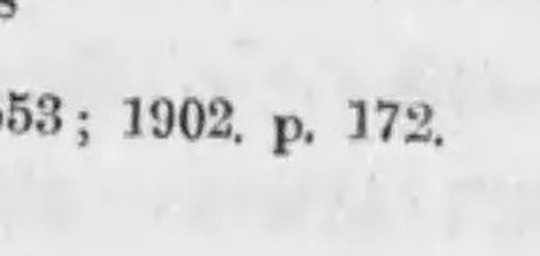,,,,,,;,,,,,
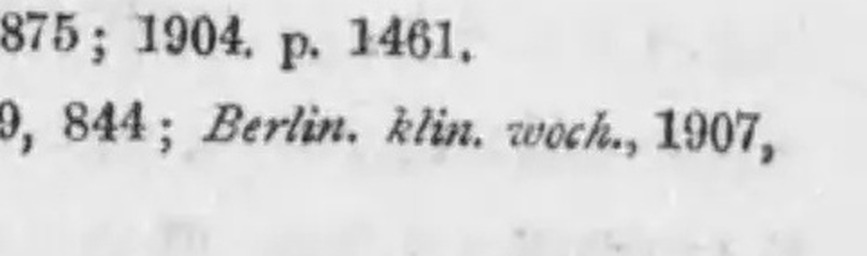,,,,,,;,,,,,
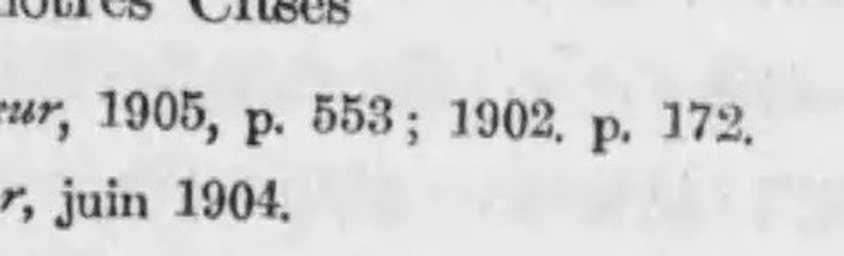,,,,,,;,,,,,
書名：伝染病ニ於ケル免疫ニ関スル研究
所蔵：国立国会図書館 National Diet Library, JAPAN
